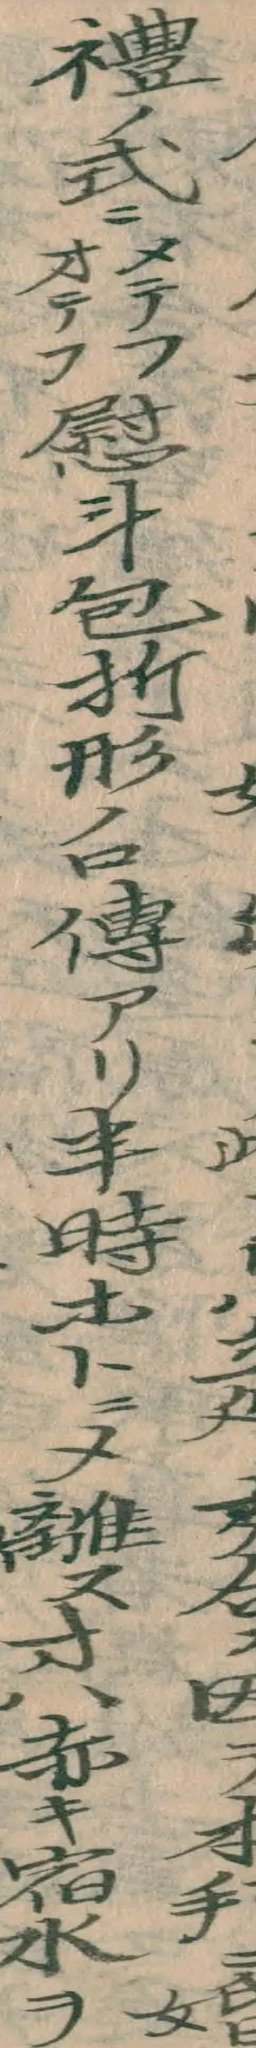禮ノ式ニメテフオテフ慰斗包折形ノ口傳アリ半時ホトニシテ離ス時ハ赤キ宿水ヲ
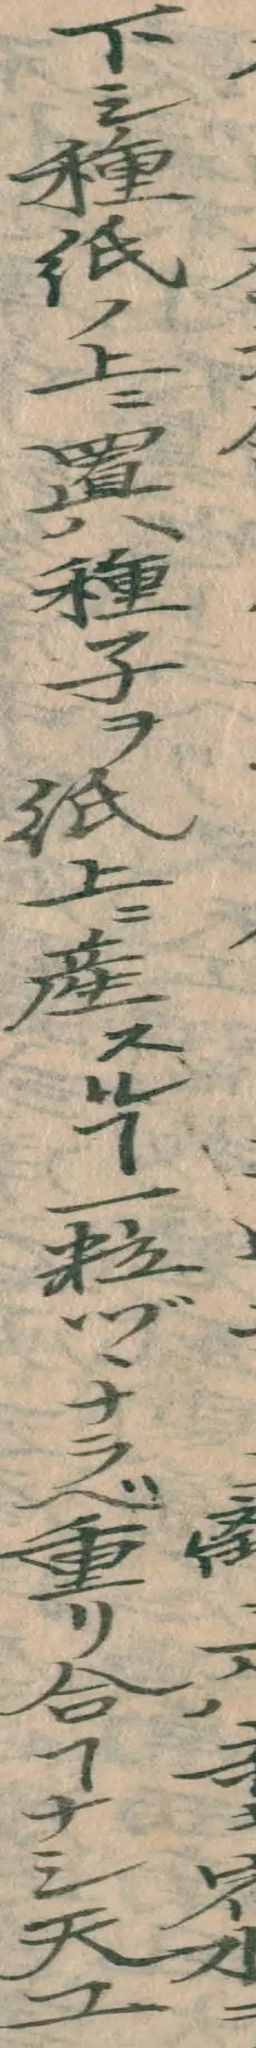下シ種紙ノ上ニ置ハ種子ヲ紙上ニ産スルコト一粒ヅヽナラベ重リ合コトナシ天工
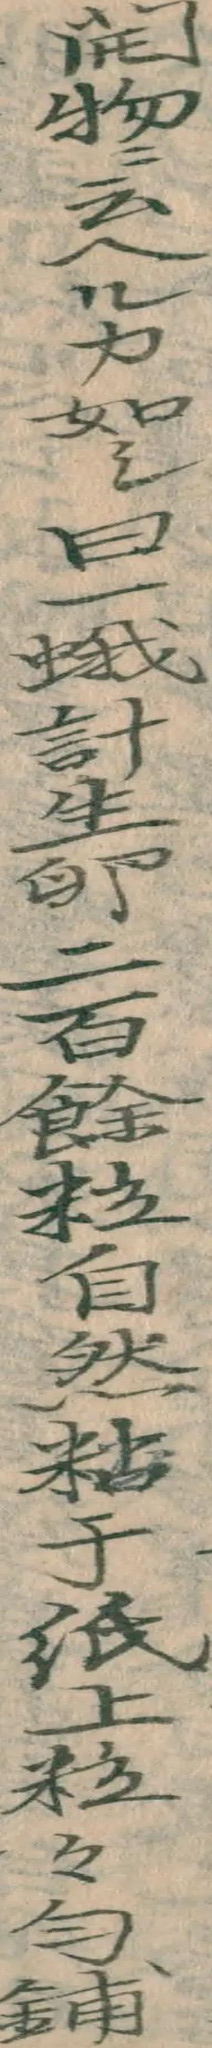開物ニ云ヘルカ如シ曰一蛾計生卵二百餘粒自然粘于紙上粒々匀鋪
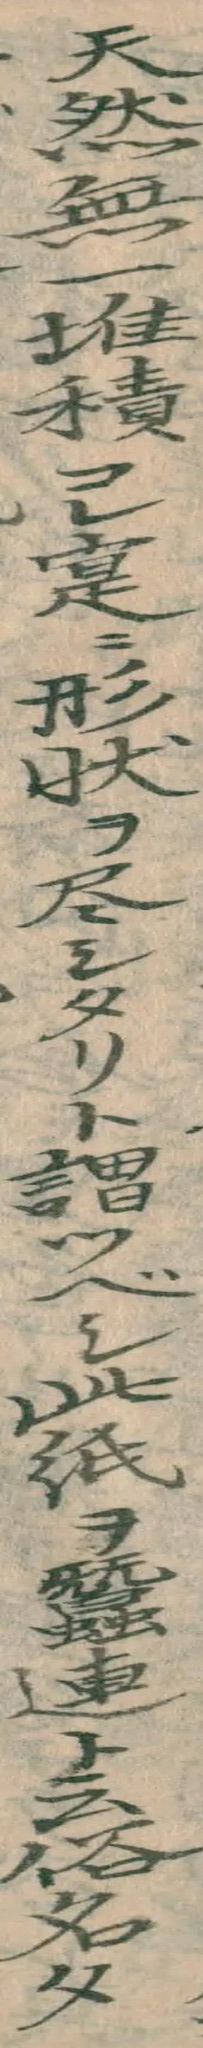天然無一堆積コレ寔ニ形状ヲ尽シタリト謂ツベシ此紙ヲ蠶連ト云俗名タ
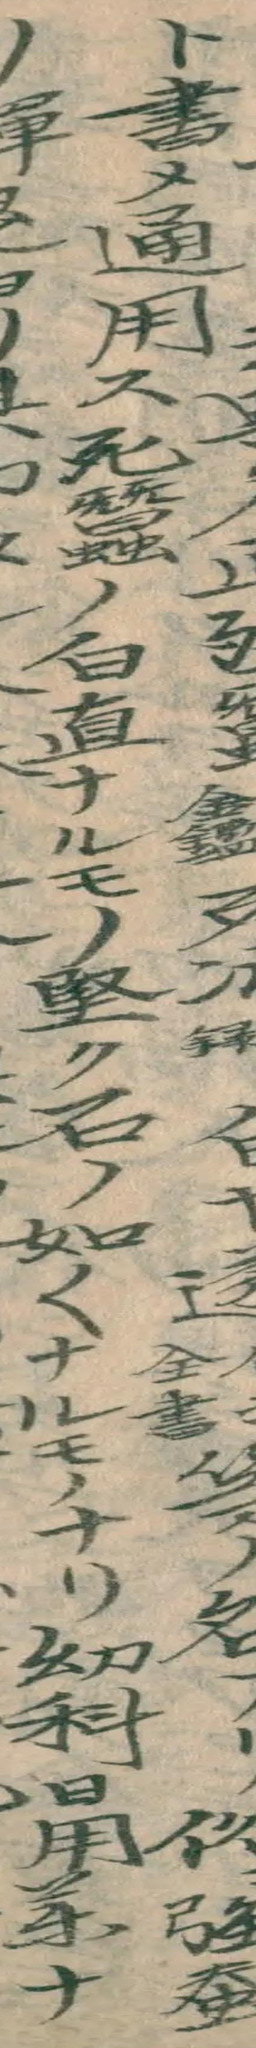ト書シテ通用ス死蠶ノ白直ナルモノ堅ク石ノ如くナルモノナリ幼科日用藥ナ
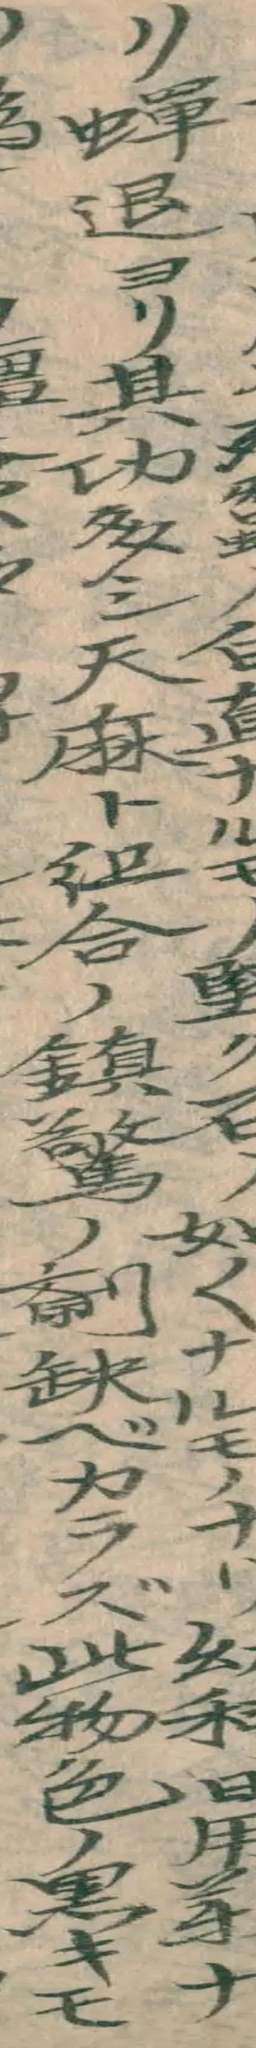リ蟬退ヨリ其功多シ天麻ト組合ノ鎮驚ノ剤缼ベカラズ此物色ノ黒キモ
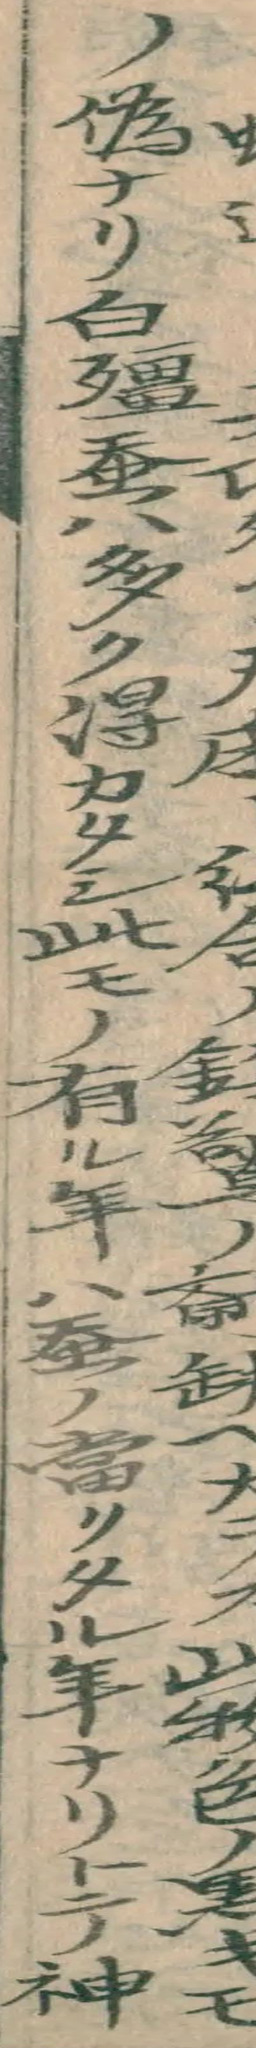ノ偽ナリ白殭蚕ハ多ク得カタシ此モノ有ル年ハ蚕ノ當リタル年ナリトテ神

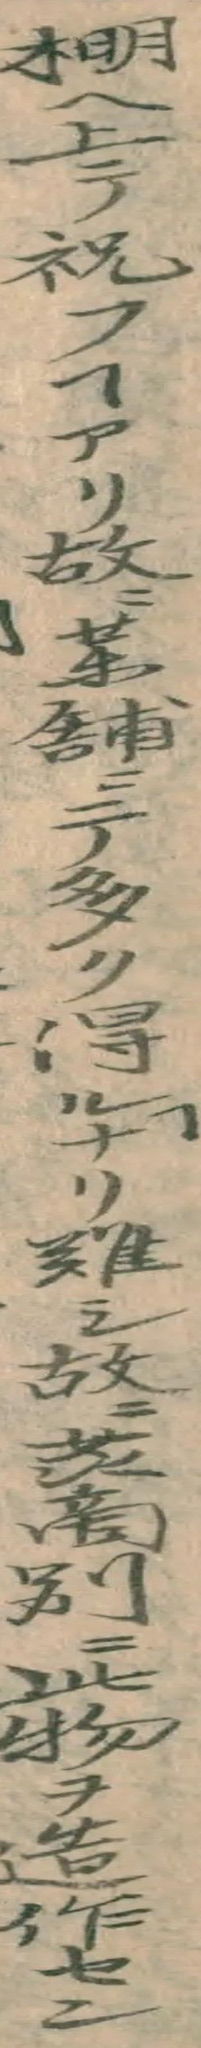棚ヘ上テ祝フコトアリ故ニ薬舗ニテ多ク得ルコトナリ難シ故ニ姦商別ニ此物ヲ造作セン
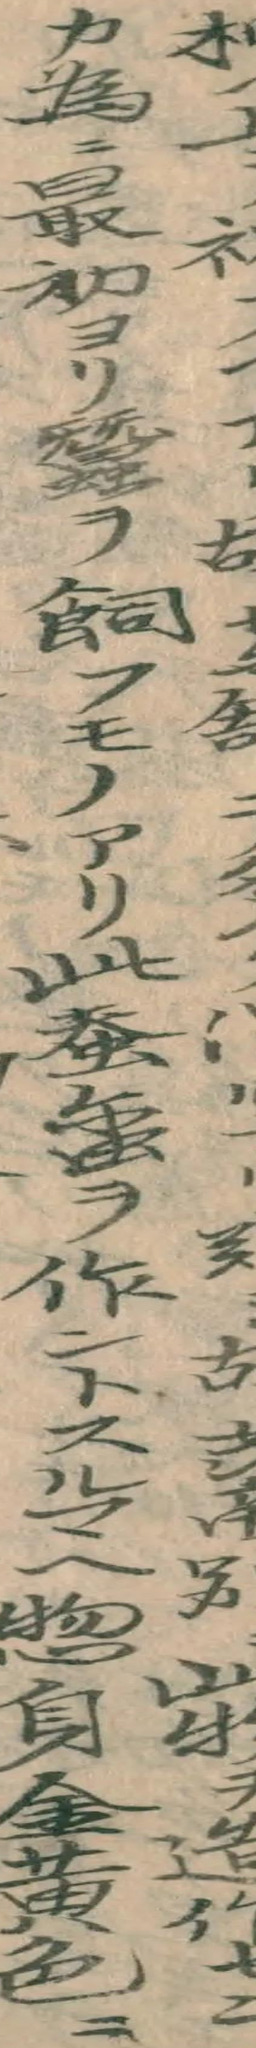カ為ニ最初ヨリ蠶ヲ飼フモノアリ此蚕𫊱ヲ作ントスルマヘ惣身金黄色ニ
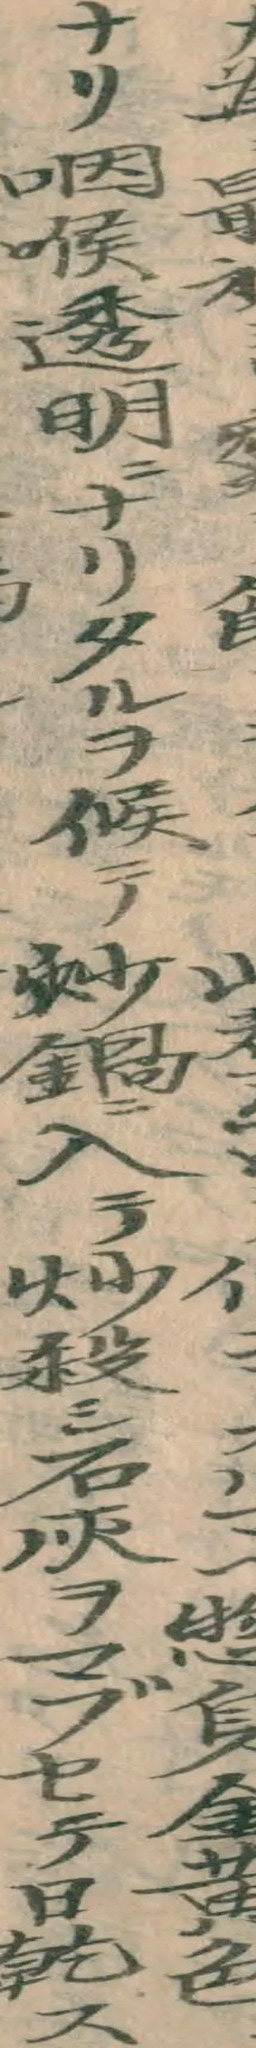ナリ咽喉透明ニナリタルヲ候テ炒沙鍋ニ入テ炒殺シ石灰ヲマブセテ日乾ス
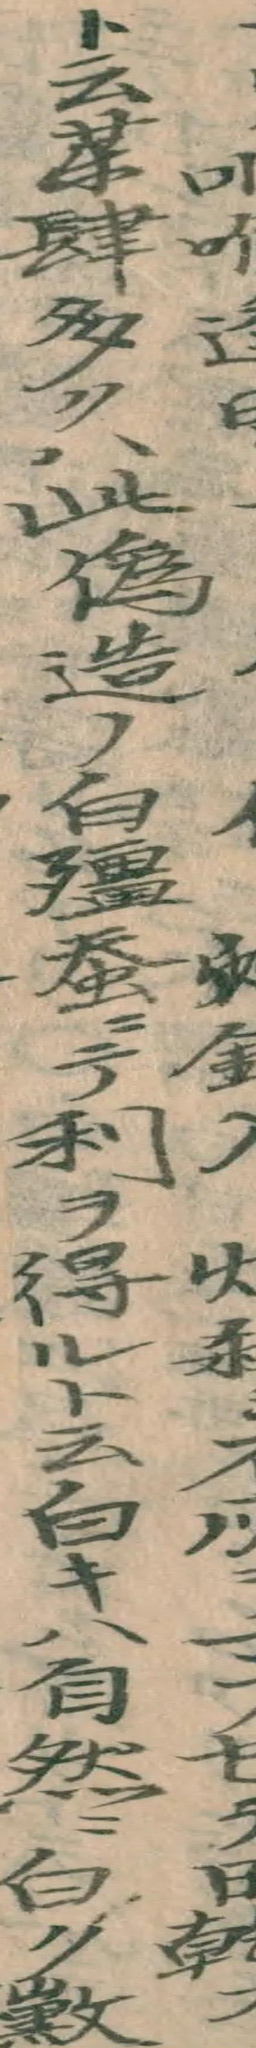ト云薬肆多クハ此偽造ノ白殭蚕ニテ利ヲ得ルト云白キハ自然ニ白ク黴
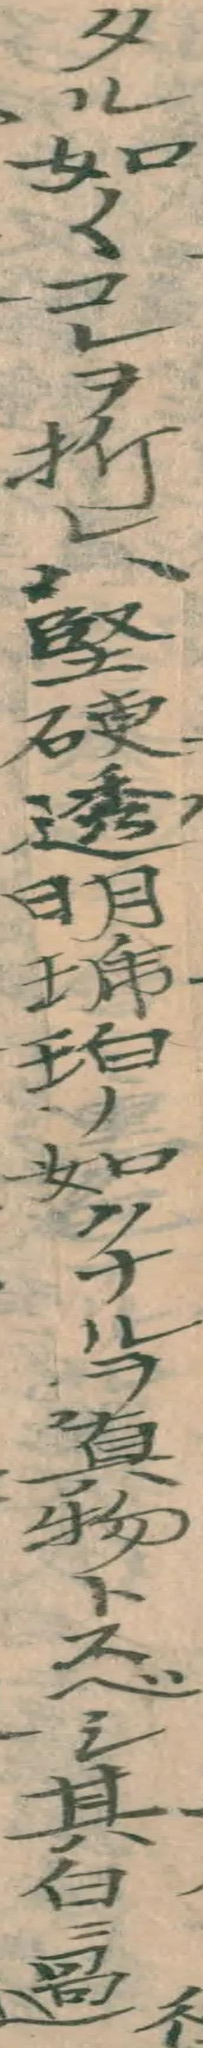タル如くコレヲ折レハ堅硬透明琥珀ノ如クナルヲ真物トスベシ其白ニ過
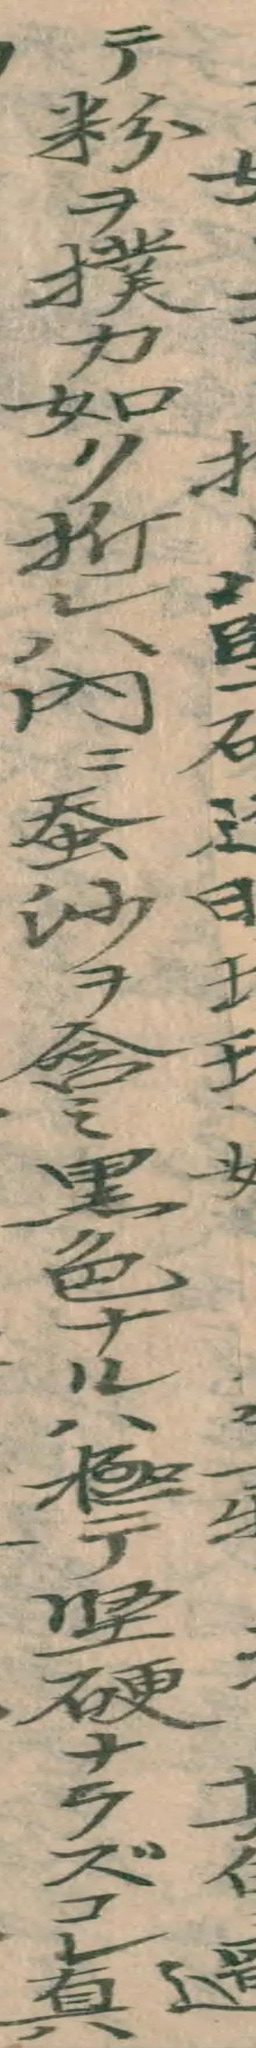テ粉ヲ撲カ如ク折レハ内ニ蚕沙ヲ含ミ黒色ナルハ極テ堅硬ナラズコレ真
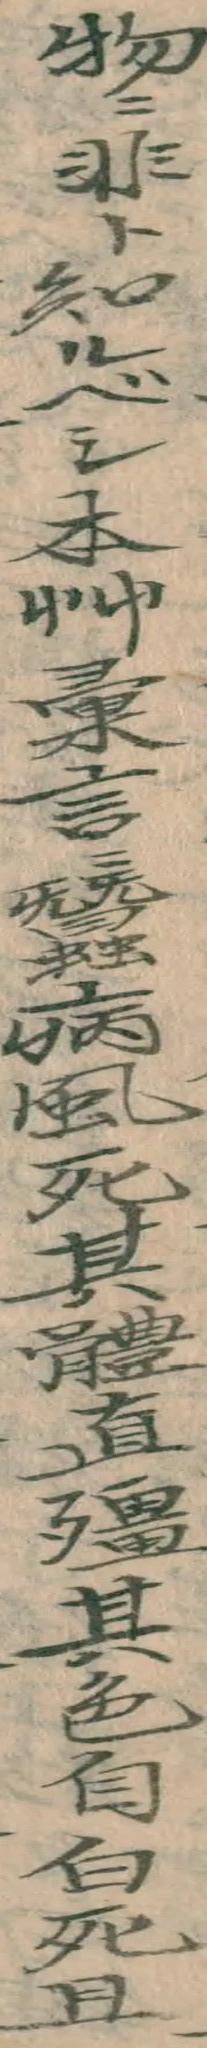物ニ非ト知ルベシ本艸彙言ニ蠶病風死其體直殭其色自白死且
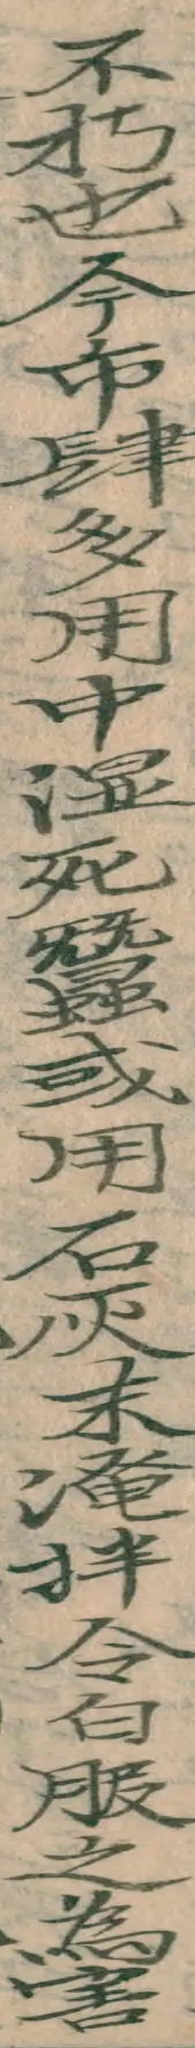不朽也今市肆多用中湿死蠶或用石灰末淹拌令白服之為害
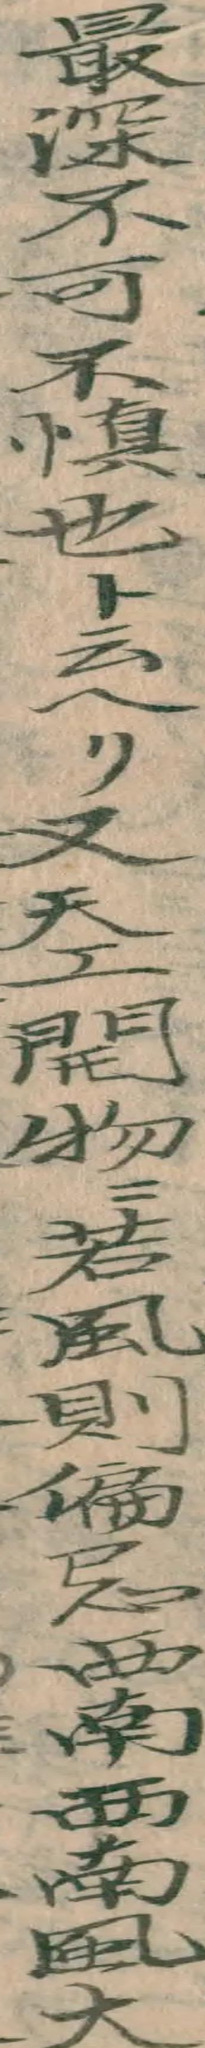最深不可不慎也ト云ヘリ又天工開物ニ若風則偏忌西南西南風大
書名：千蟲譜 3巻. [1]
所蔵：国立国会図書館 National Diet Library, JAPAN
